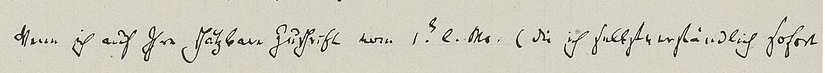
Wenn ich auf Ihre schätzbare Zuschrift vom 1t. l. Ms. (die ich selbstverständlich sofort
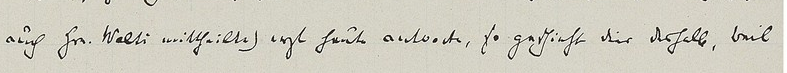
auch Hrn. Welti mittheilte) erst heute antworte, so geschieht dies deshalb, weil
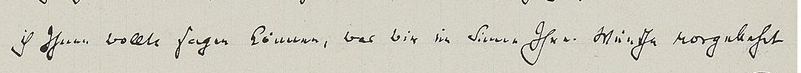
ich Ihnen wollte sagen können, was wir im Sinne Ihrer Wünsche vorgekehrt
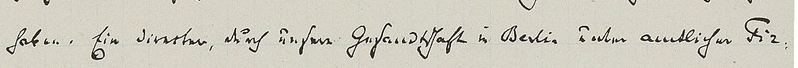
haben. Ein directer, durch unsere Gesandtschaft in Berlin unter amtlicher Fir-
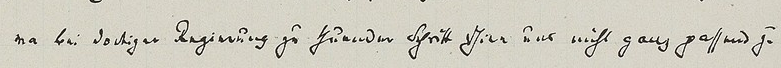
ma bei dortiger Regierung zu thuender Schritt schien uns nicht ganz passend zu
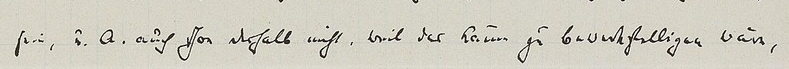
sein, u. A. auch schon deshalb nicht, weil der kaum zu bewerkstelligen wäre,
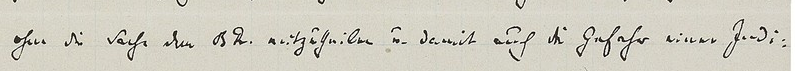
ohne die Sache dem BR. mitzutheilen u. damit auch die Gefahr einer Indi-
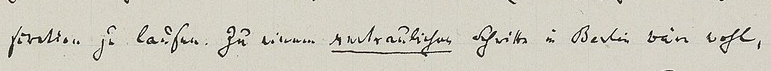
scretion zu laufen. Zu einem vertraulichen Schritte in Berlin wäre wohl,
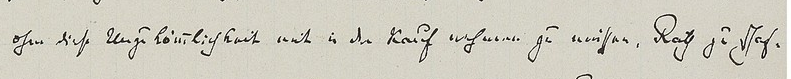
ohne diese Unzukömmlichkeit mit in den Kauf nehmen zu müssen, Rath zu schaf-
